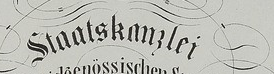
Staatskanzlei
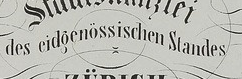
des eidgenössischen Standes
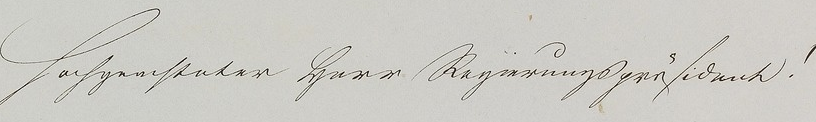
Hochgeachteter Herr Regierungspräsident!
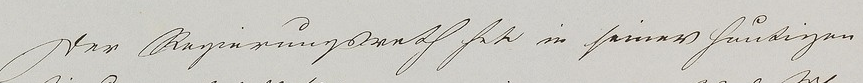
Der Regierungsrath hat in seiner heutigen
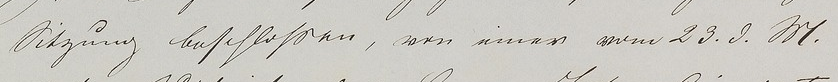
Sitzung beschloßen, von einer vom 23. d. M.
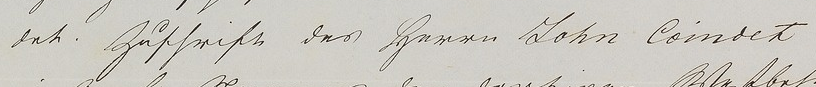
erh. Zuschrift des Herrn John Coindet
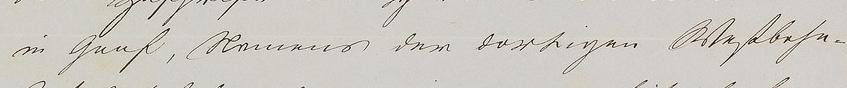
in Genf, Namens der dortigen Westbahn--
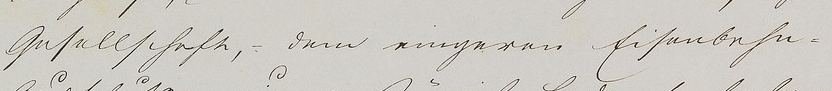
Gesellschaft, dem engeren Eisenbahn--
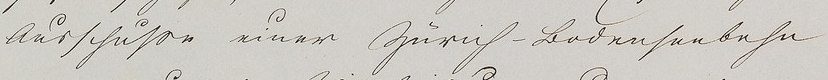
Ausschuße einer Zürich–Bodenseebahn
